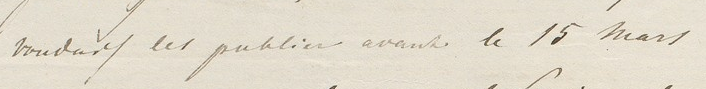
voudrais les publier avant le 15 Mars
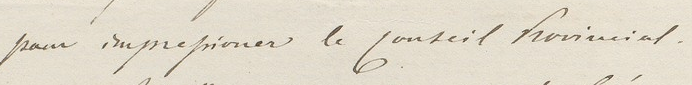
pour impressioner le Conseil Provincial.
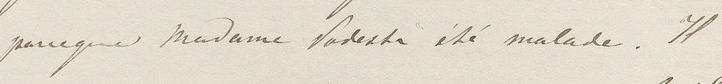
parceque Madame Podesta été malade. Il
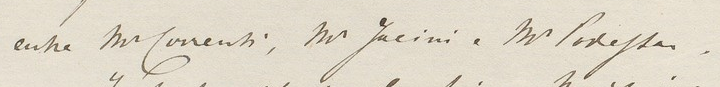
entre MrCorrenti, MrJacini & MrPodesta.
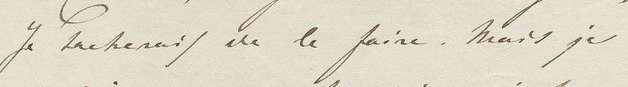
Je tacherais de le faire. Mais je
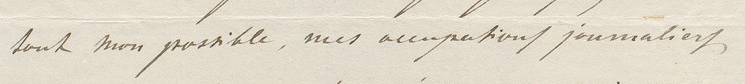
tout mon possible, mes occupations journaliers
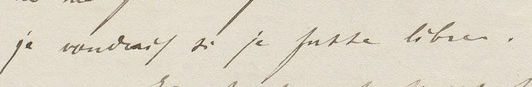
je voudrais si je fusse libre.
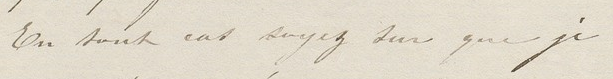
En tout cas soyez sur que je
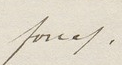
forces.
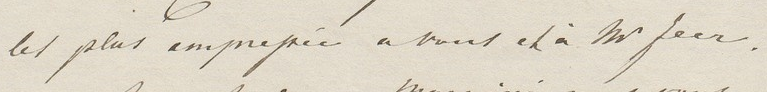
les plus empressée a vous et à MrFeer.
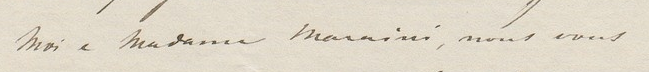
Moi e Madame Maraini, nous vous
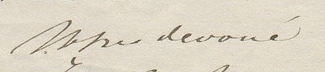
Votre devoué
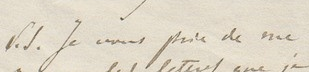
P. S. Je vous prie de me
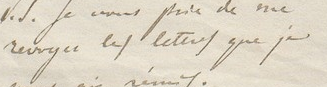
revoyer les lettres que je
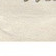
rémis.
